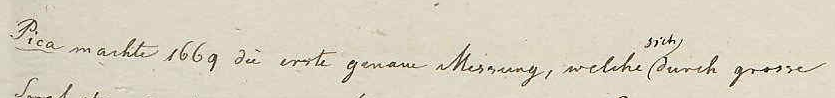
Pica machte 1669 die erste genau Messung, welche sich durch grosse
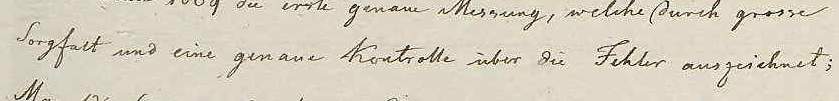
Sorgfalt und eine genaue Kontrolle über die Fehler auszeichnet;
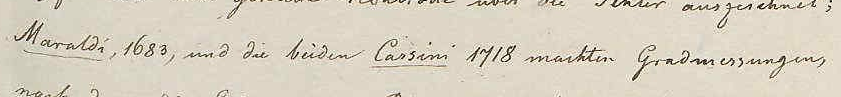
Maraldi, 1683, und die beiden Cassini 1718 machten Gradmessungen,
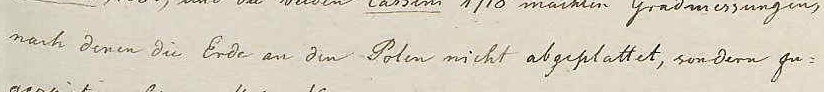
nach denen die Erde an den Polen nicht abgeplattet, sondern zu-
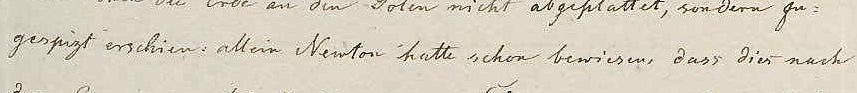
gespizt erschien: allein Newton hatte schon bewiesen, dass dies nach
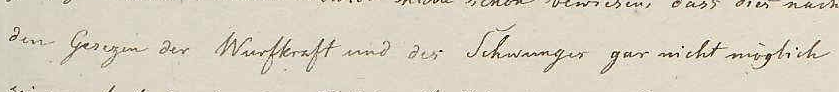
den Gesezen der Wurfkraft und des Schwunges gar nicht möglich
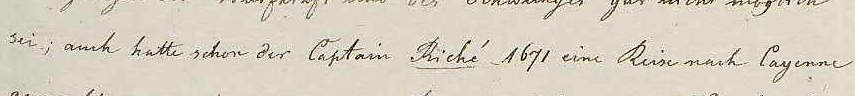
sei; auch hatte schon der Captain Riché 1671 eine Reise nach Cayenne
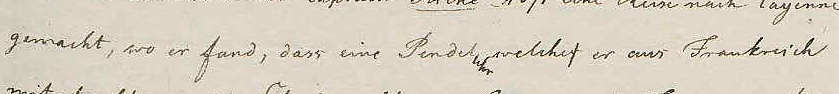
gemacht, wo er fand, dass eine Pendeluhr welches er aus Frankreich
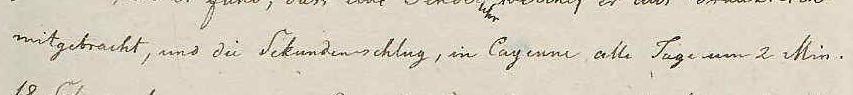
mitgebracht, und die Sekunden schlug, in Cayenne alle Tage um 2 Min.
